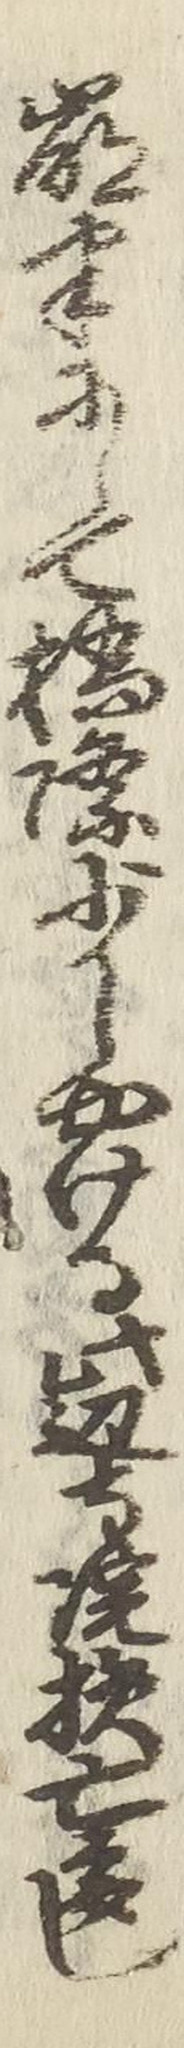崩半にして橋際少しやける此辺寺院損亡多し
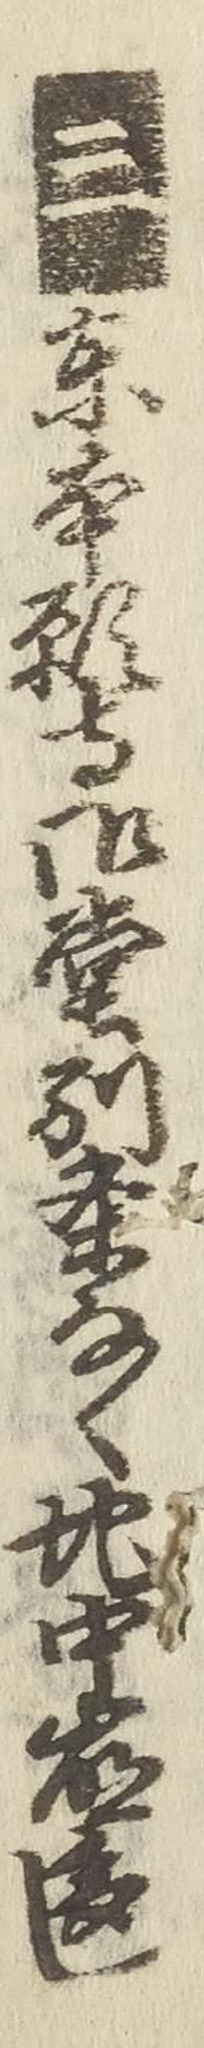三東本願寺御堂別条なく地中崩多し
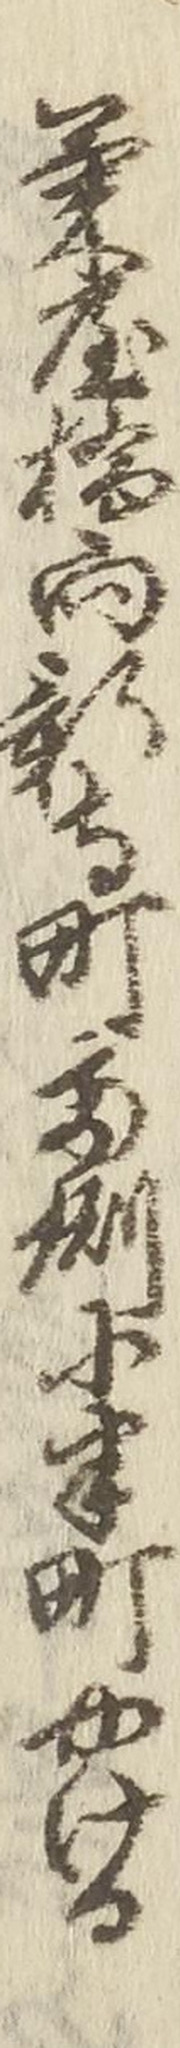菊屋橋向新寺町両側小半町やける
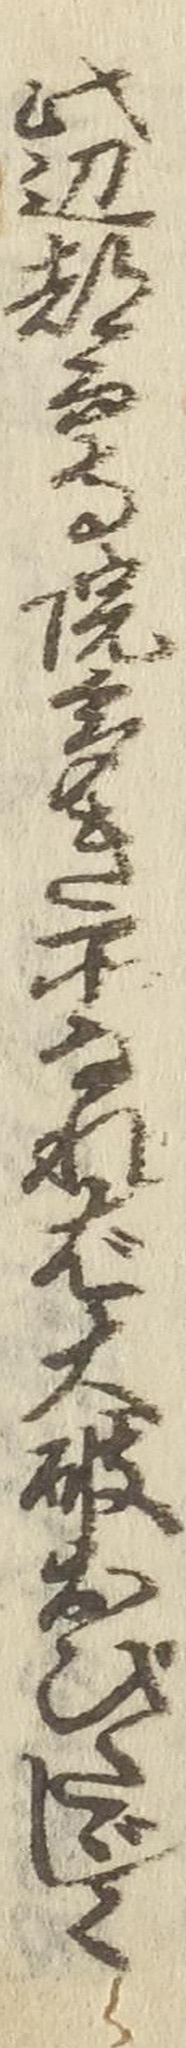此辺都而寺院多き所なれば大破おびたゞしく
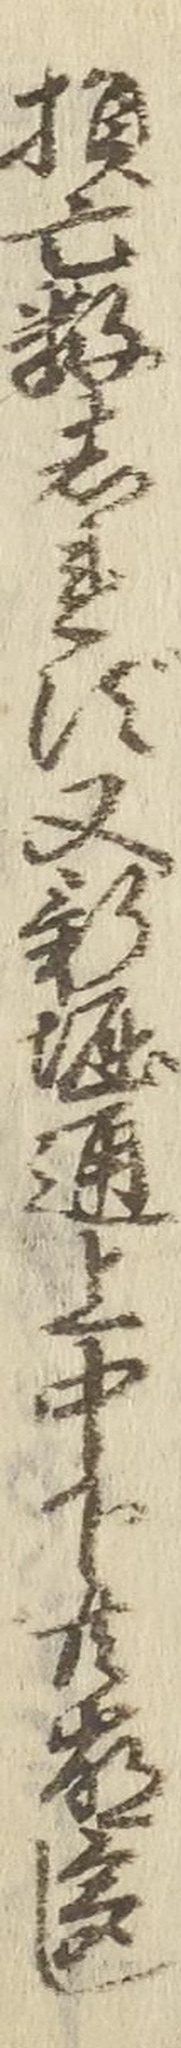損亡数しれず又新堀通上中下共崩多し

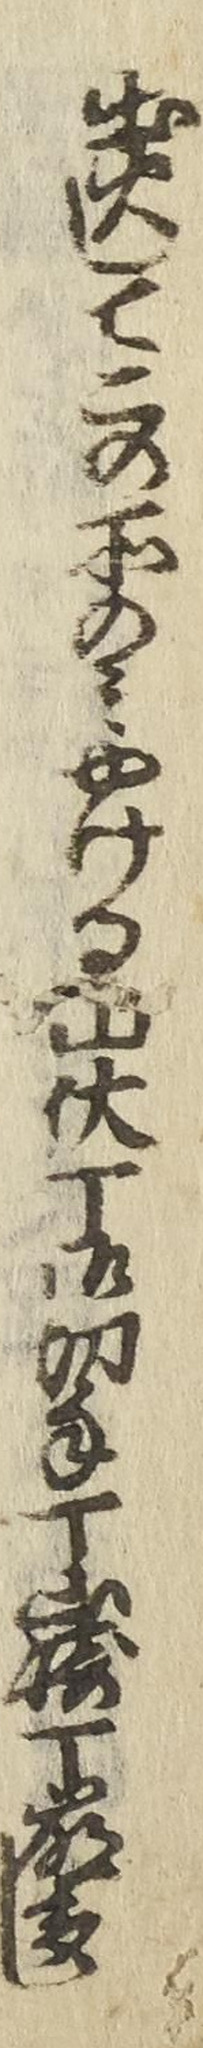出火してこの所のみやける山伏丁御切手丁山崎丁崩多し
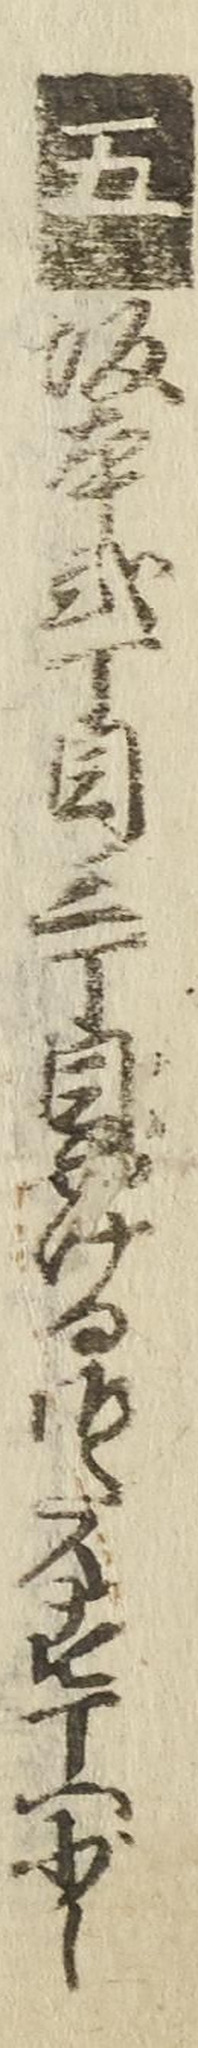五坂本弐丁目三丁目やける御たんす丁は少し
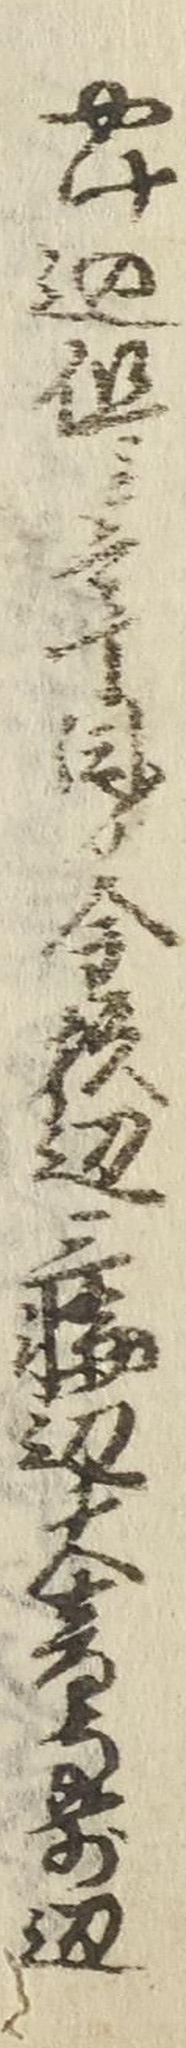やけ込但し壱丁目ゟ金杉辺三輪辺大音寺前辺
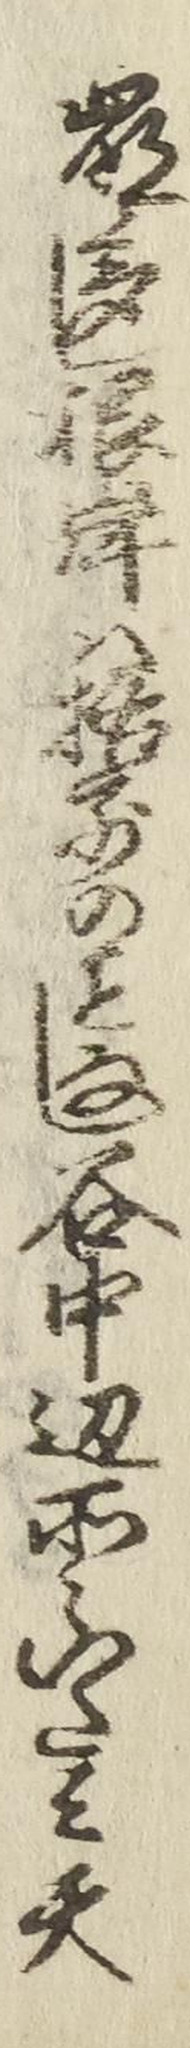崩多し根岸は各別のことなし谷中辺所々いたみ天
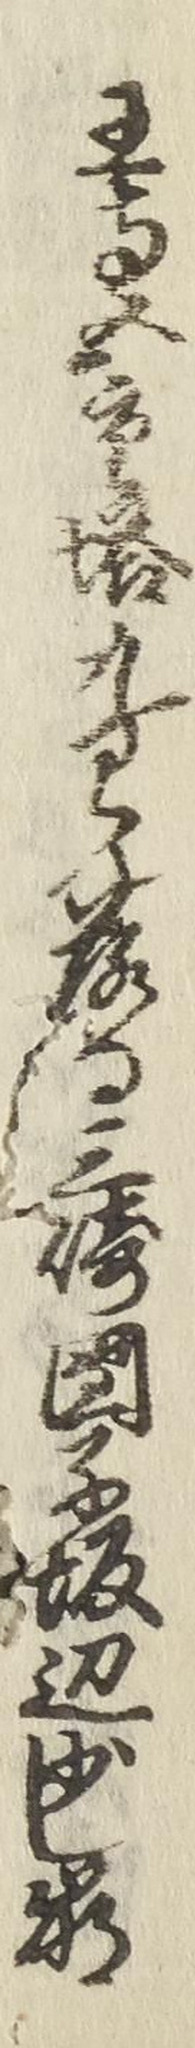王寺五重塔九りん落る三崎団子坂辺少し崩
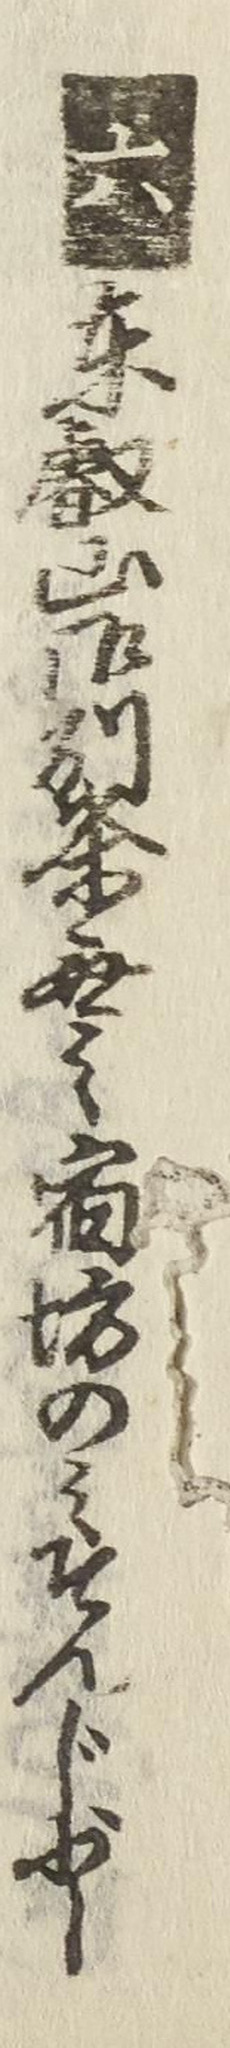六東叡山御別条無之宿坊のみそんじ少
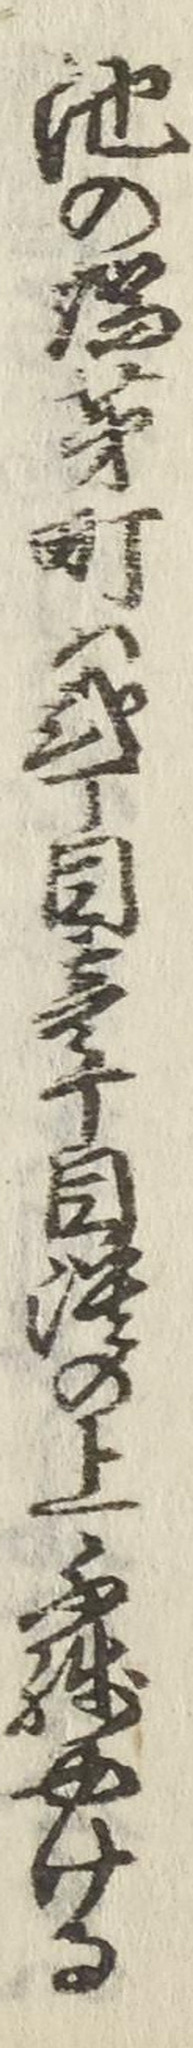池の端茅町は弐丁目壱丁目潰の上不残やける
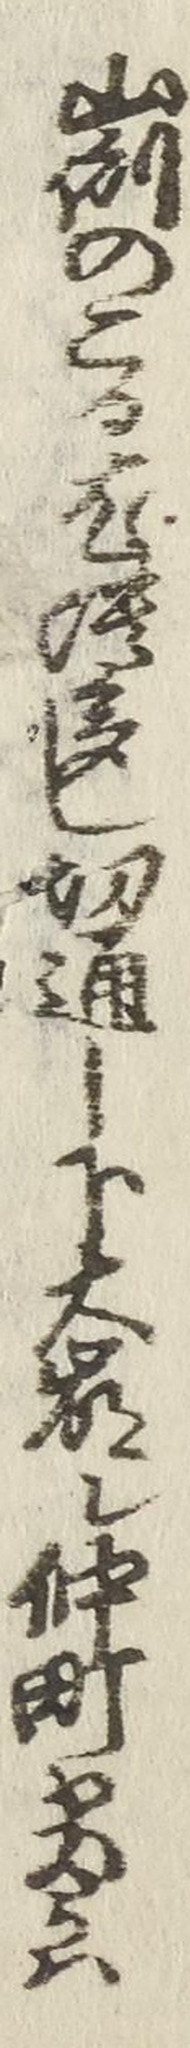山側のこる尤潰多し切通し下大崩レ仲町両かは
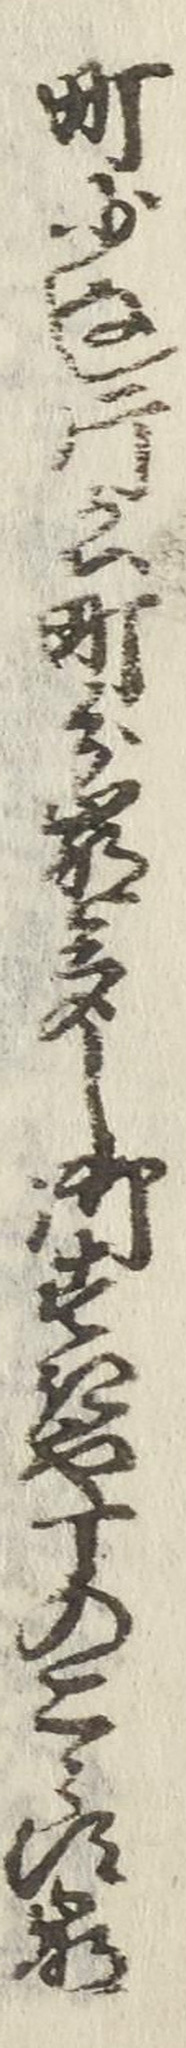町少なし片かは町文崩多し御すきや丁のこらず崩
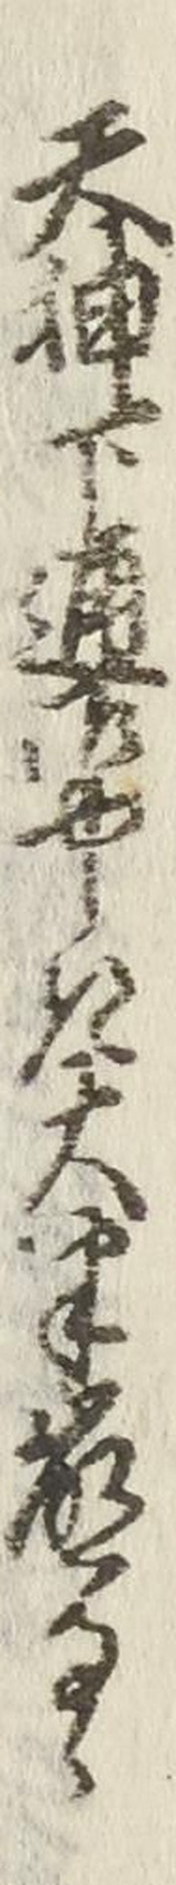炭塵下通御やしき大半崩るゝ
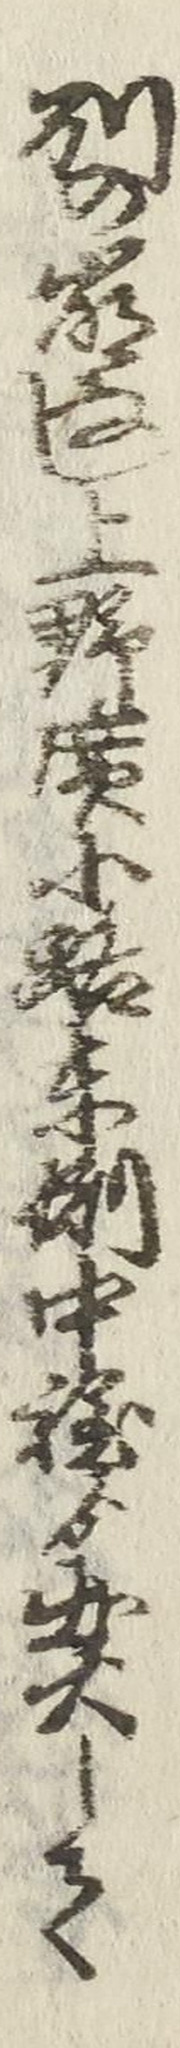別の崩なし上野広小路東側中程ゟ出火して
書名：地震出火　男女死人怪我人書上之寫
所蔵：東京大学地震研究所図書室 Earthquake Research Institute Library, The University of Tokyo, JAPAN
